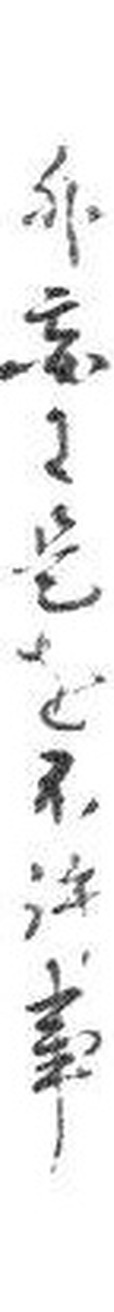外妄に是を不許事
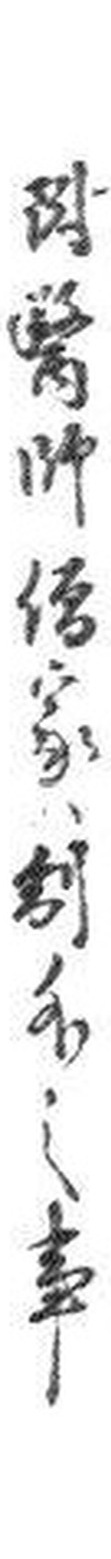附医師僧家は制外之事
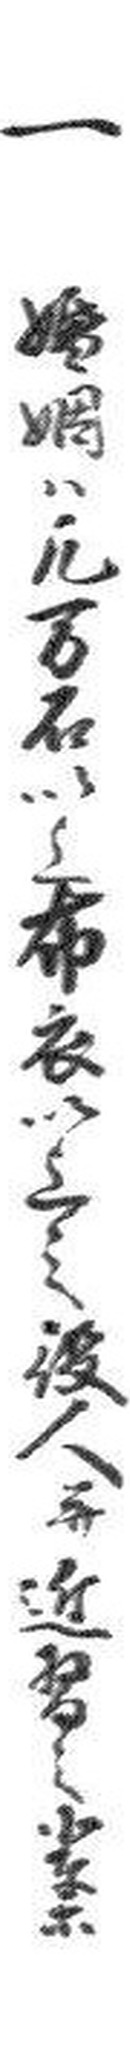一婚姻は凡万石以上布衣以上之役人幷近習の輩等
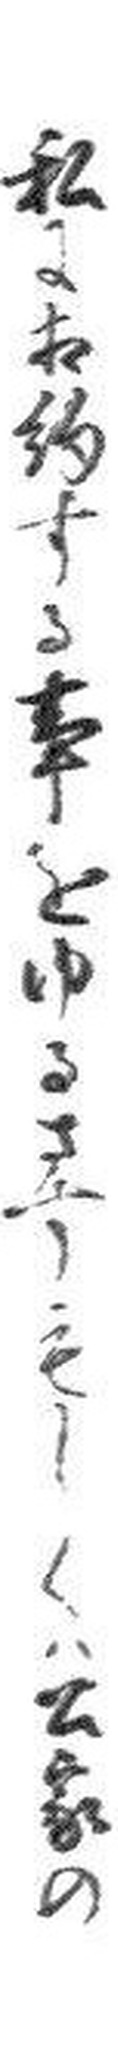私に相約する事をゆるさすもしくは公家の
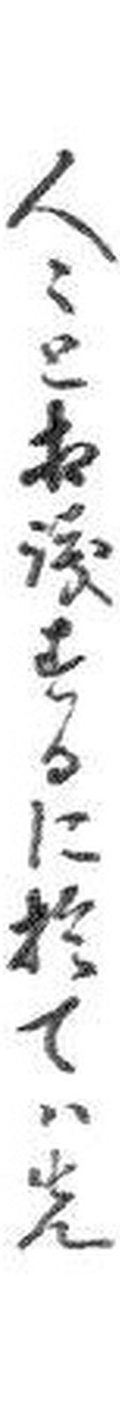人々と相議するに於ては先
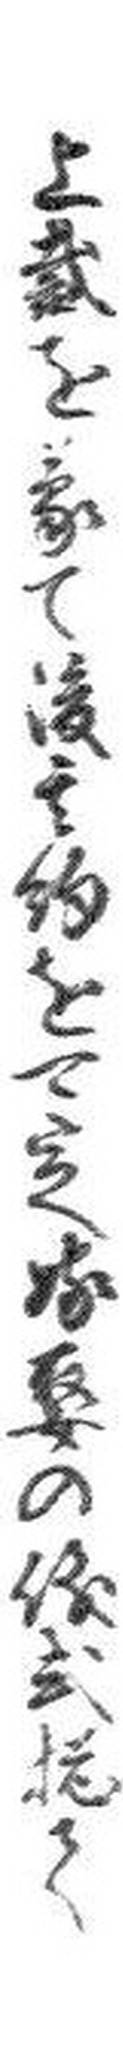上裁を蒙て後其約を可定嫁娶の儀式総て
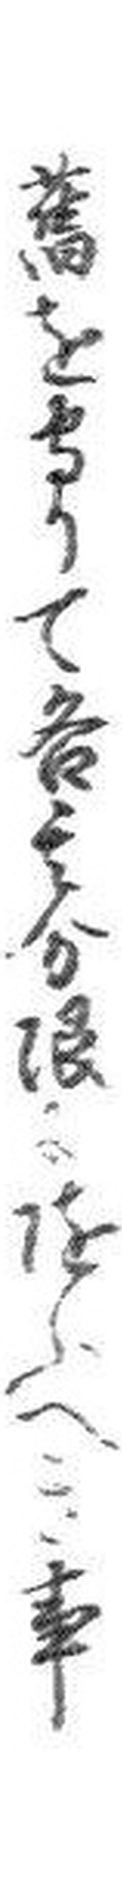旧を守りて各其分限に随ふへき事
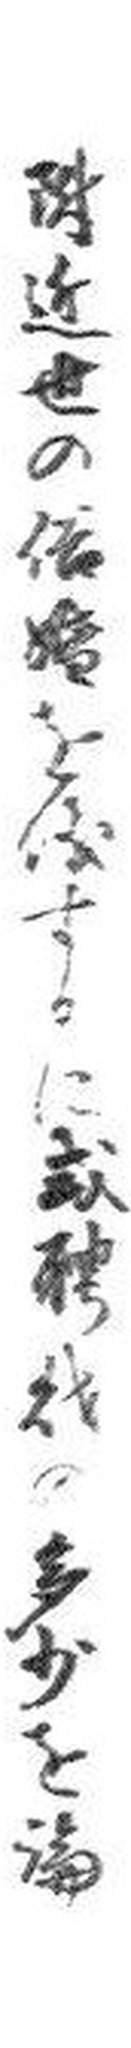附近世の俗婚を儀するに或聘財の多少を論
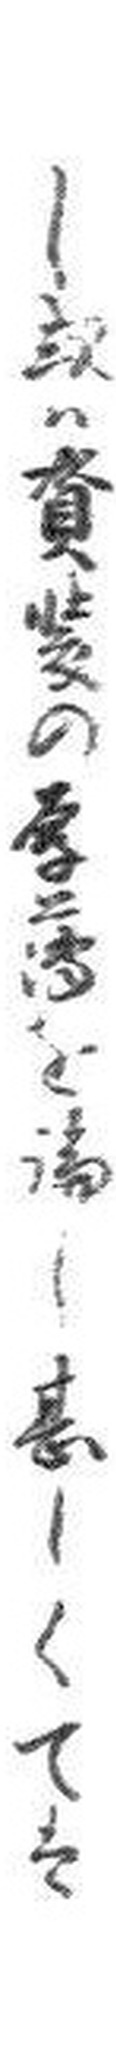し或は資装の厚薄を論し甚しくては
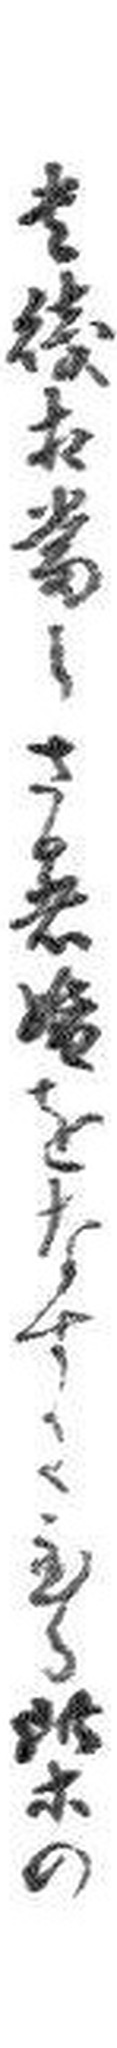貴賤相当らさる者婚をなすに至る此等の
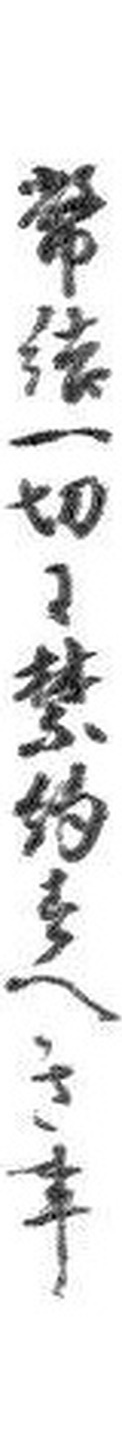幣結一切に禁約すへき事

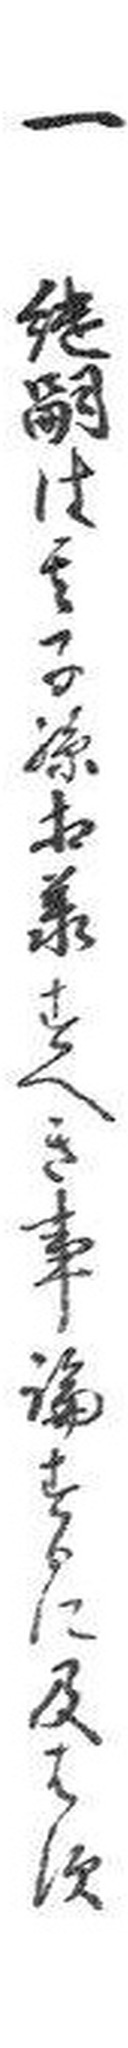一継嗣は其子孫相承すへき事論するに及はす
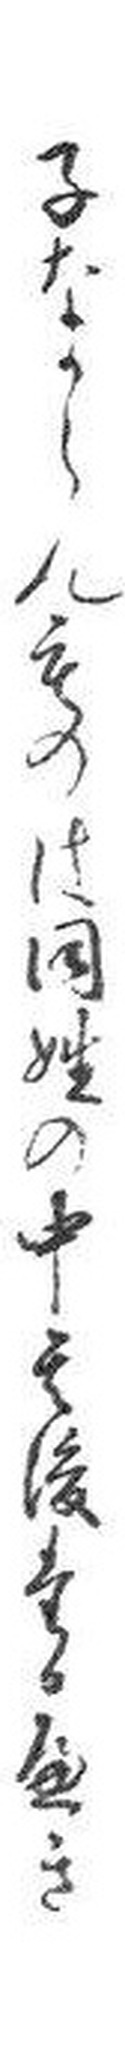子なからんものは同姓の中其後たるへき
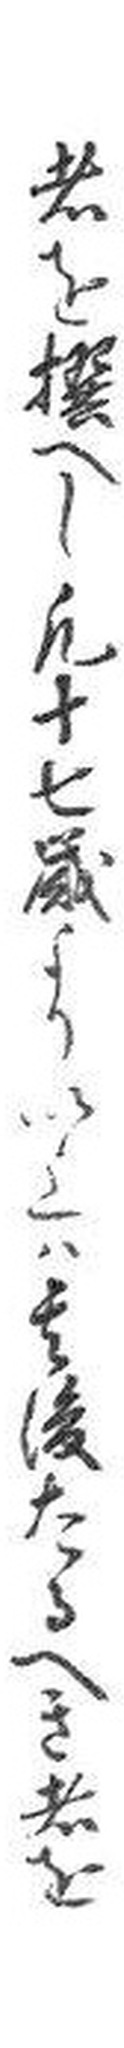者を撰へし凡十七歳より以上は其後たるへき者を
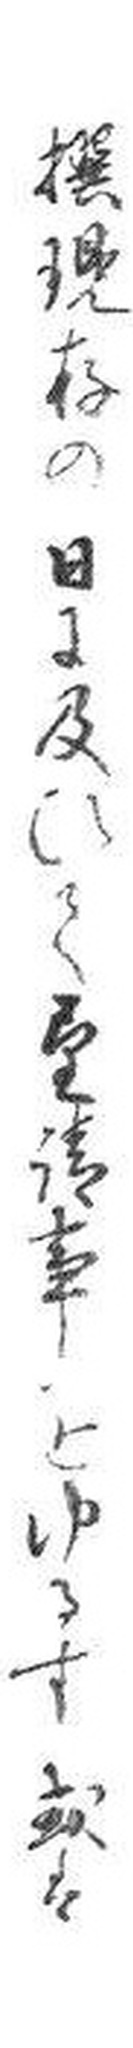撰現存の日に及ひて望請事をゆるす或は
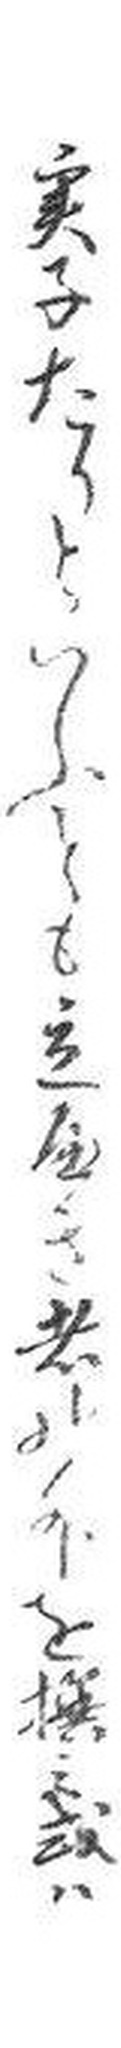実子たりといふとも立へき者の外を撰み或は
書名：家譜 二十五 吉品公 従宝永六年到同七年
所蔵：福井県文書館 Fukui Prefectural Archives
